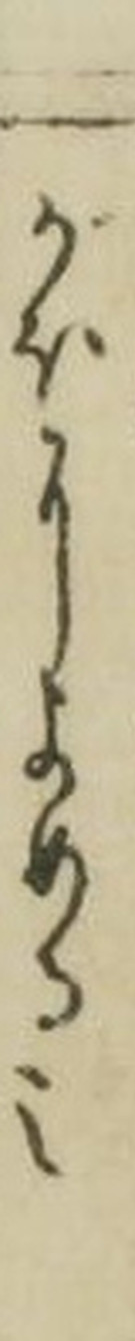がほによめる也
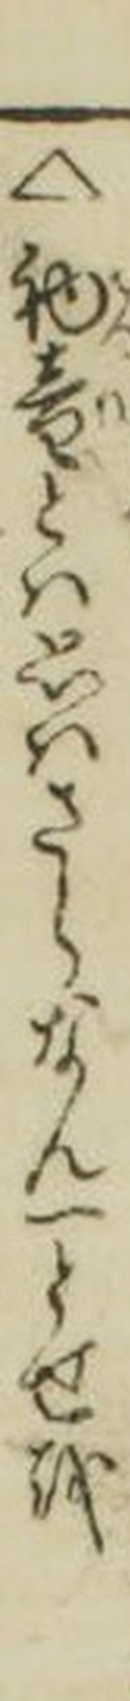△初音とは思はさらなん一とせを
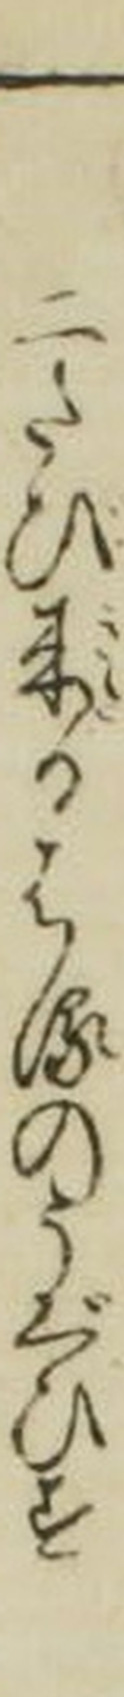二たび来るはるのうぐひす
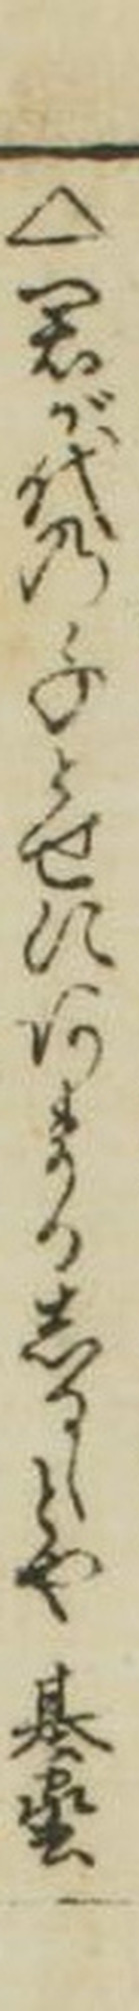△君が代の千とせにあまるしるしとや基家公
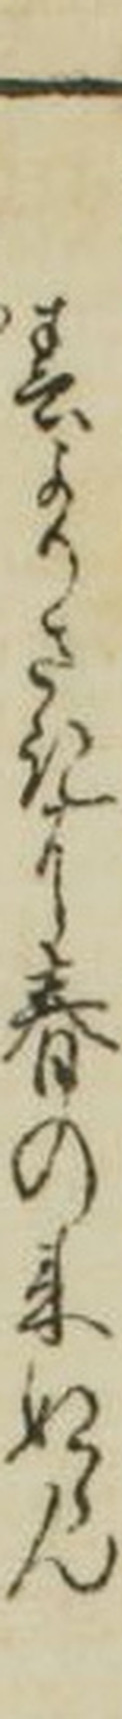春よりさきに春の来ぬらん
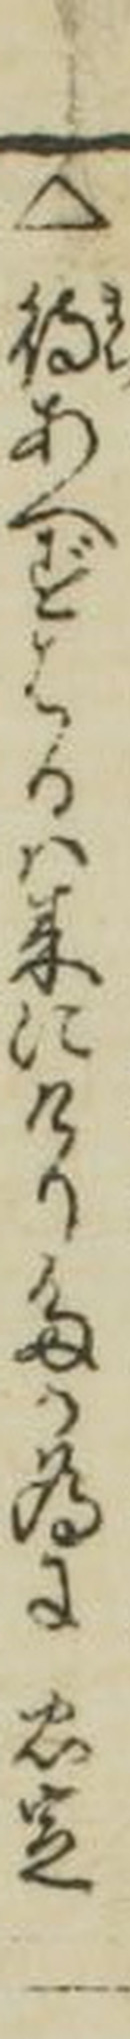△待あへずはるは来にけりたか為に忠定
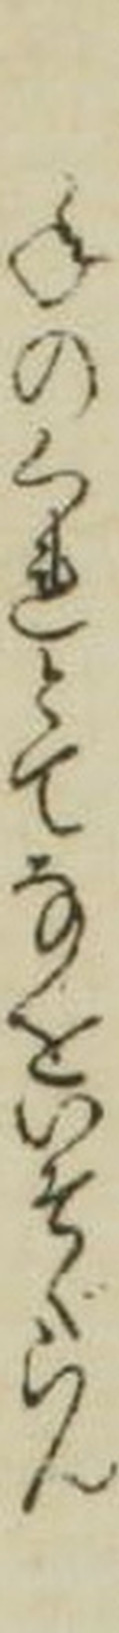年のくれとてなをいそぐらん
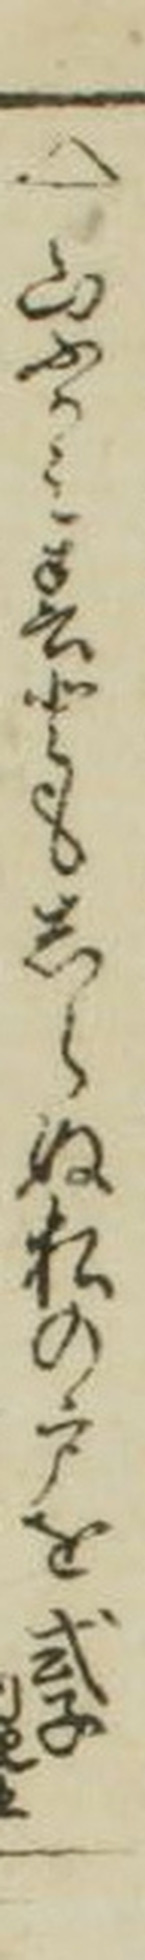△山ふかみ春ともしらぬ松の戸を式子
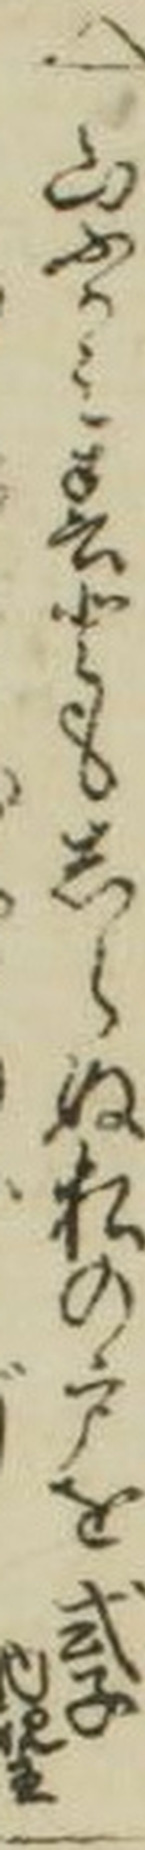△山ふかみ春ともしらぬ松の戸を式子
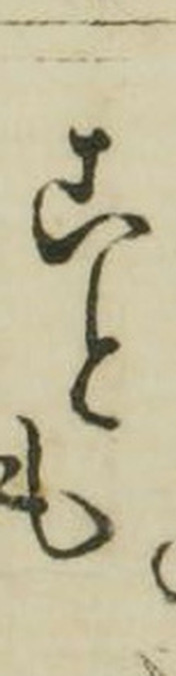ことも
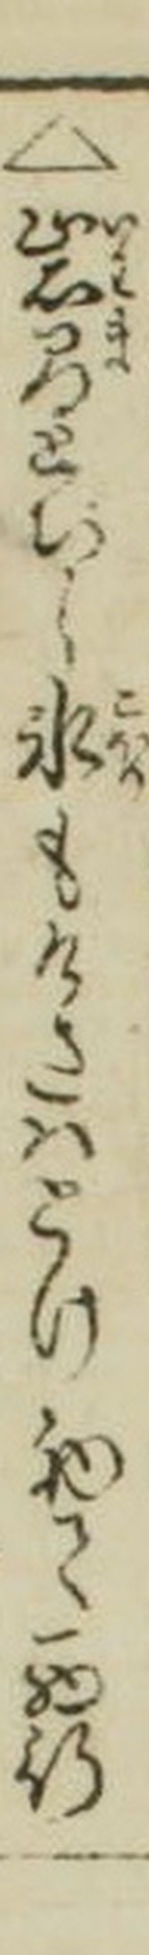△岩間とぢし氷もけさはとけ初て西行
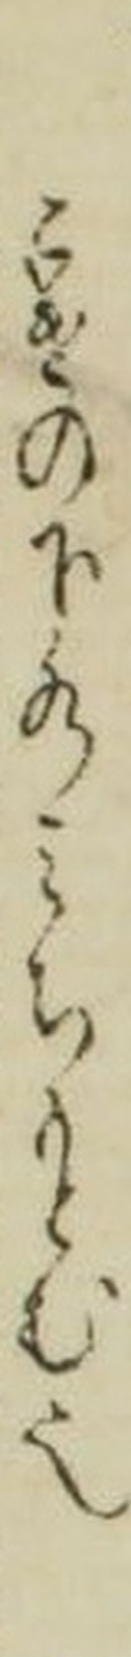こけの下水みちうとむ也
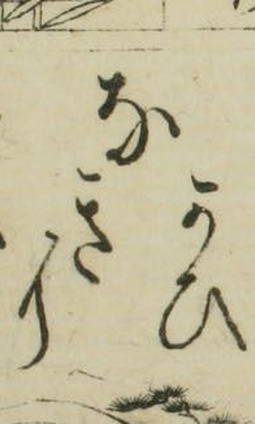なきに
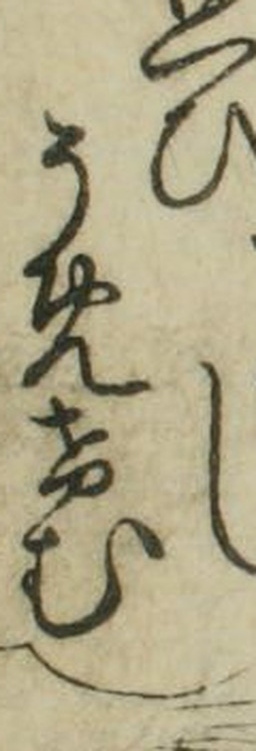そめけむ

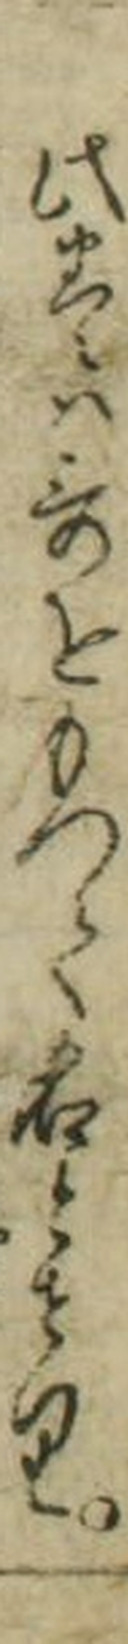此巻は哥をもつて名とせり。
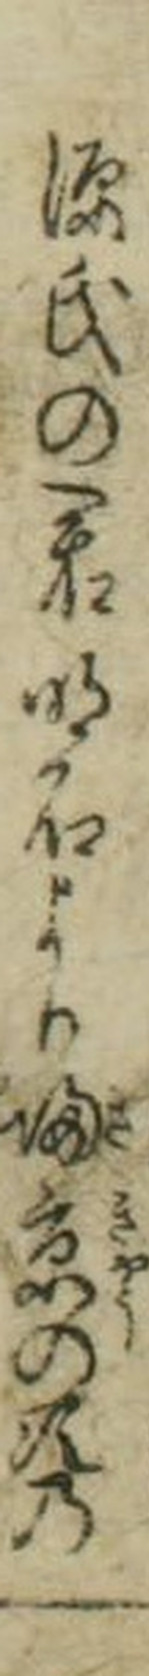源氏の君明石より帰京の頃の
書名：女源氏教訓鑑
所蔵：東京学芸大学附属図書館
